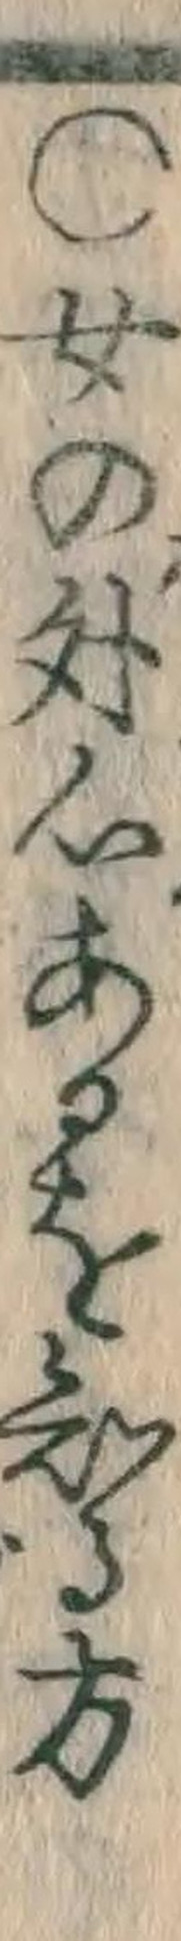○女の外心あるを知る方
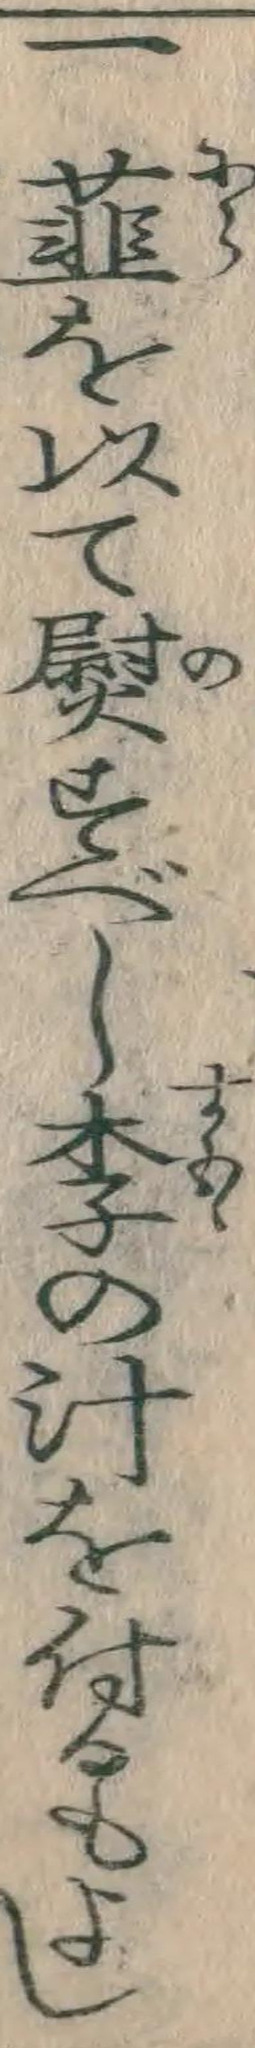一韮を以て熨すべし李の汁を付るもよし
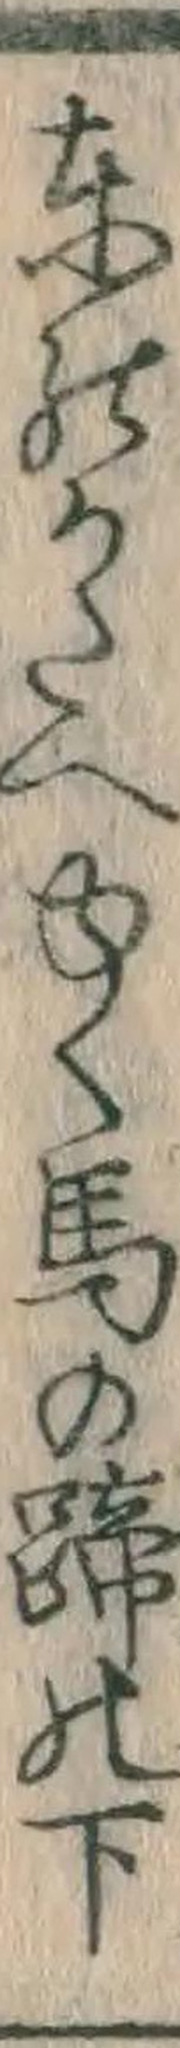東のかたへゆく馬の蹄の下
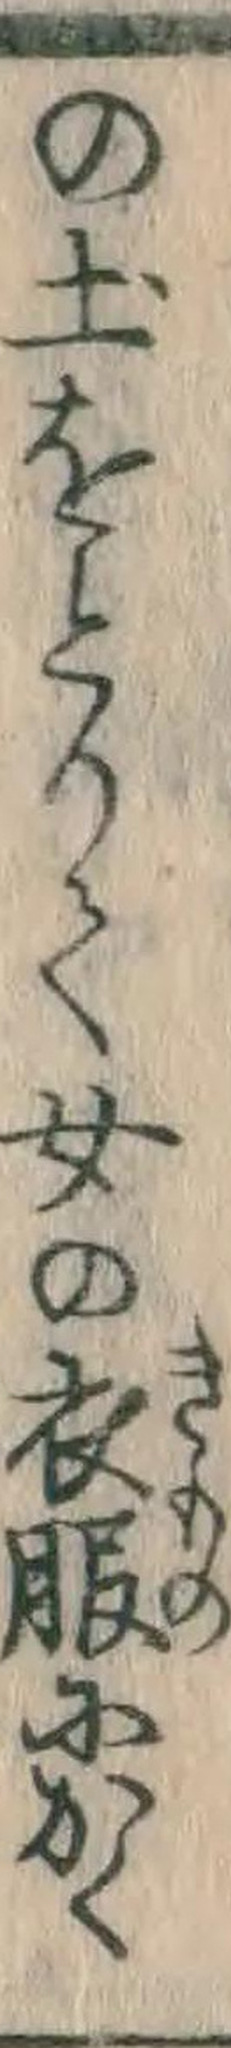の土をとりて女の衣服にかく
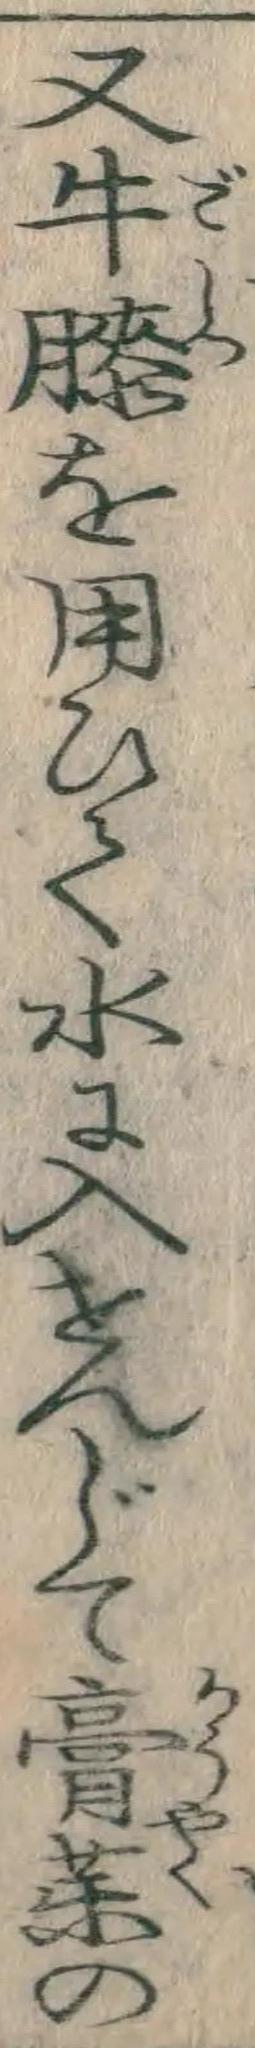又牛膝を用ひて水に入せんじて膏薬の
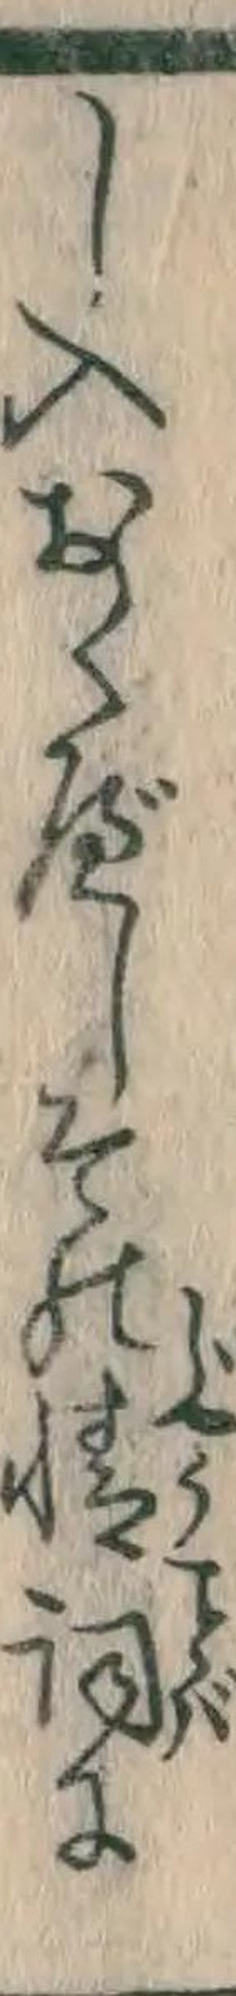し入おくべしその情詞に
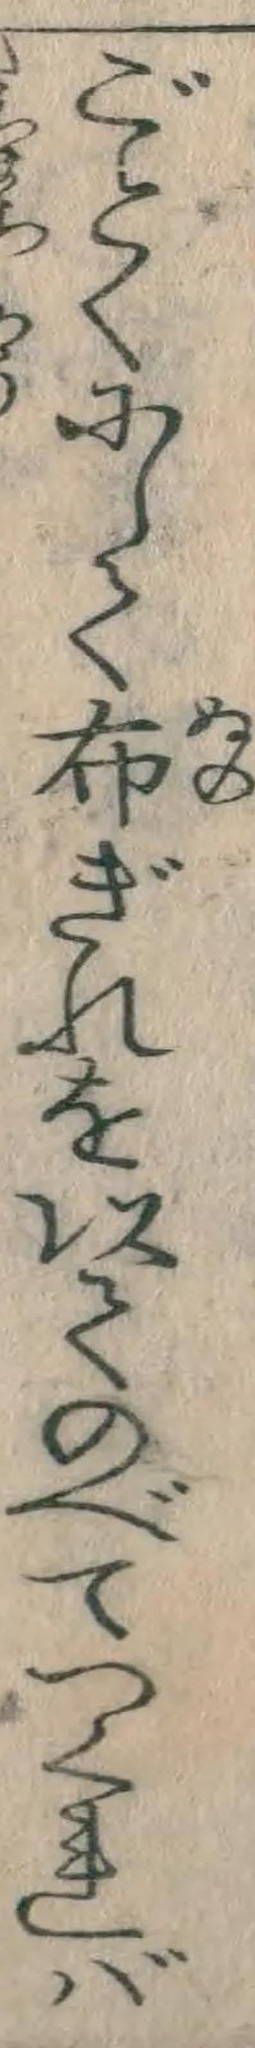ごとくにして布ぎれを以てのべてつくれば
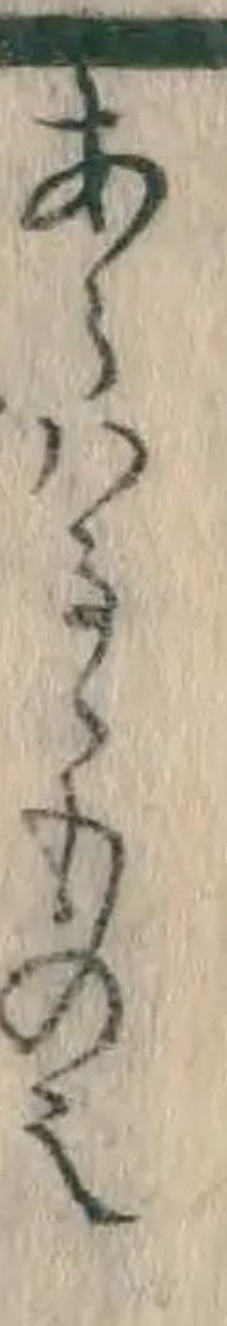あらはるゝもの也
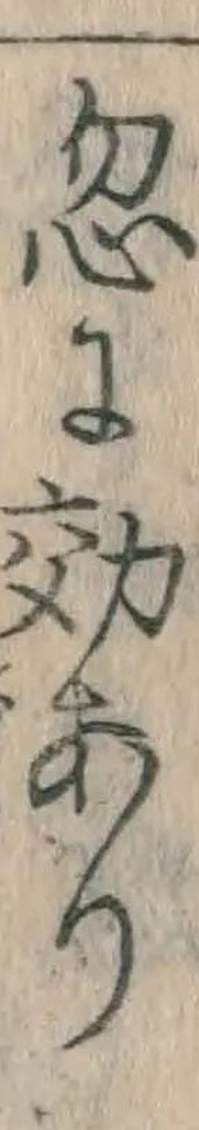忽に効あり
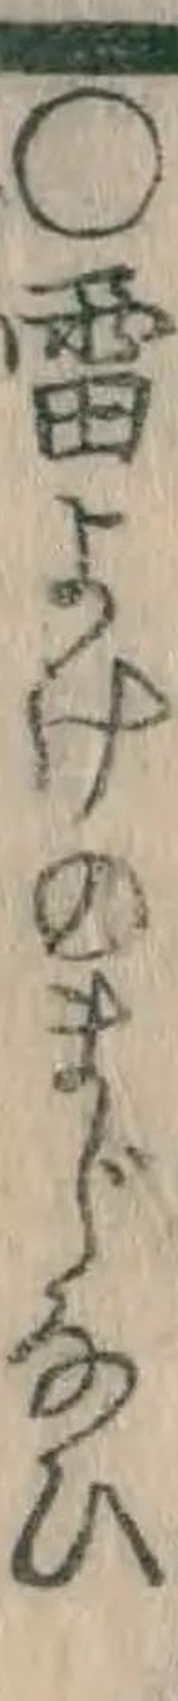○雷よけのまじなひ
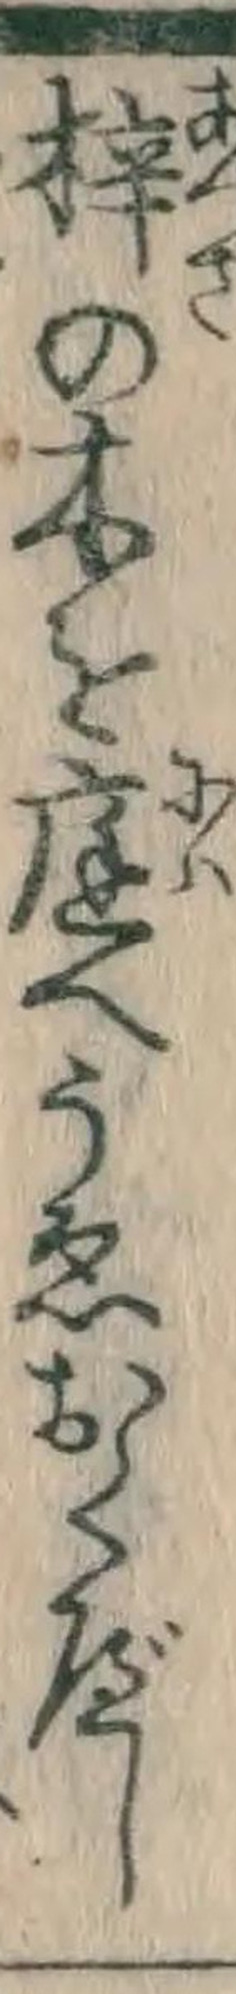梓の木を庭へうゑおくべし
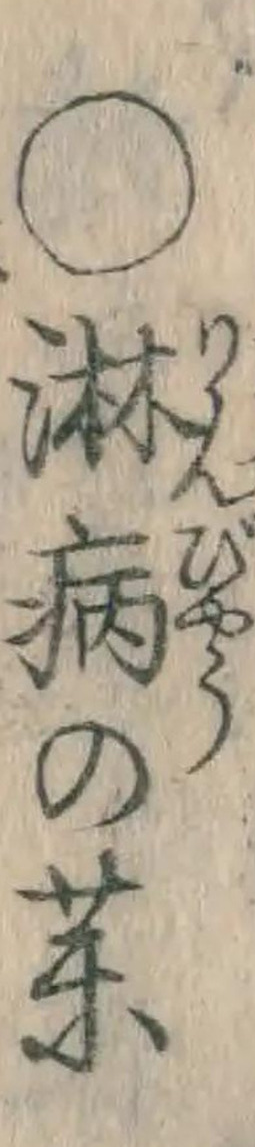○淋病の薬
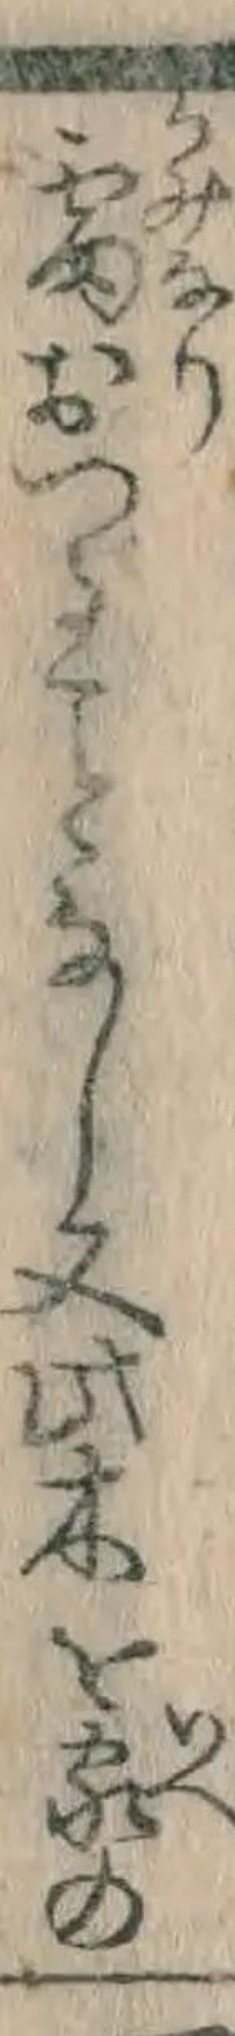雷おつることなし又此木を家の

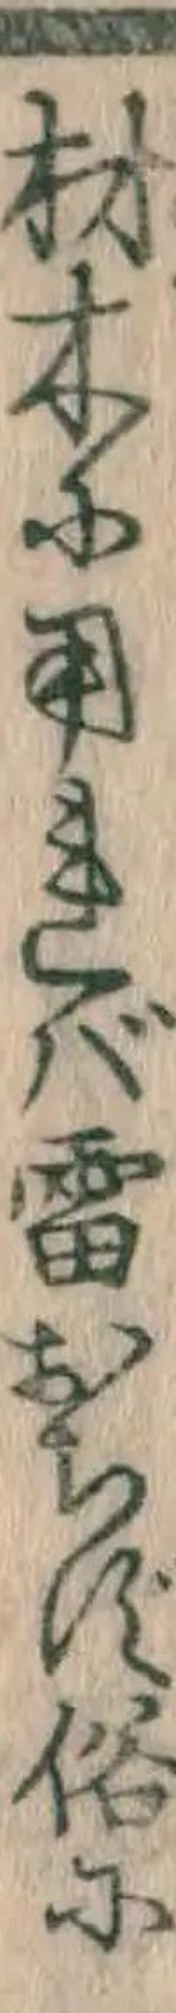材木に用れば雷おちず俗に
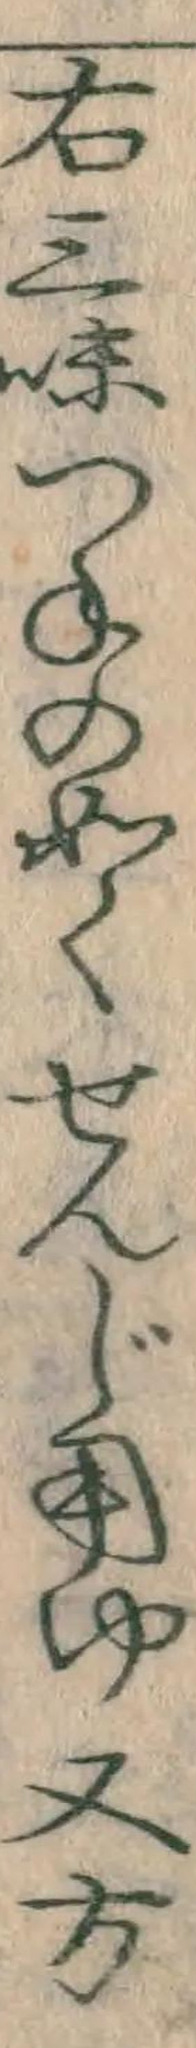右三味つねの如くせんじ用ゆ又方
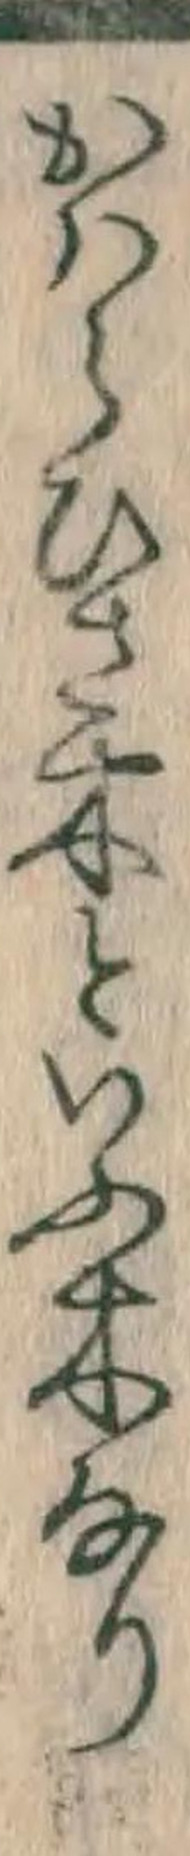かはらひさ木といふ木なり
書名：広益秘事大全 3巻. [4]
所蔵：国立国会図書館 National Diet Library, JAPAN
